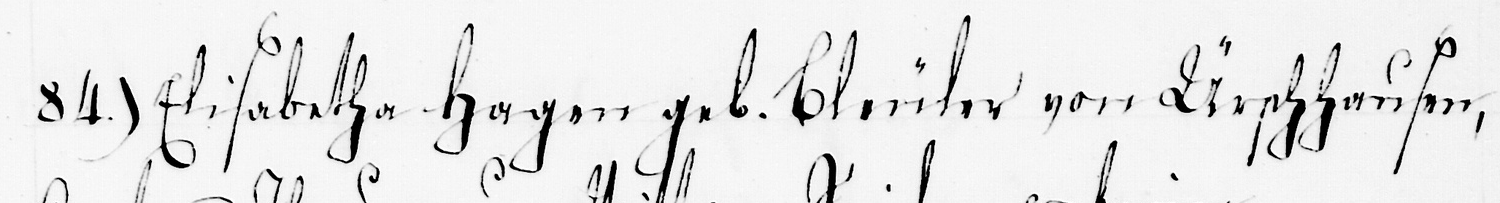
84.) Elisabetha Hagen geb. Bleuler von Ürschhausen,
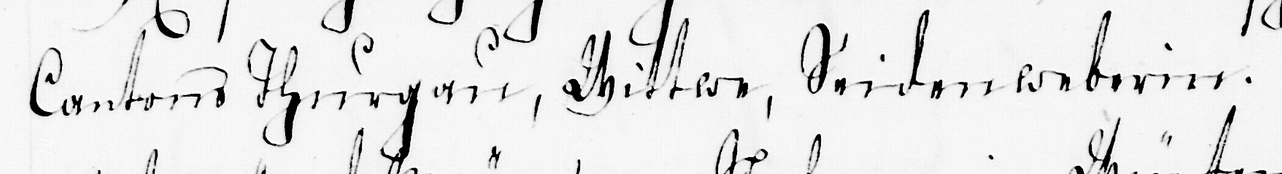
Cantons Thurgau, Wittwe, Seidenweberin.
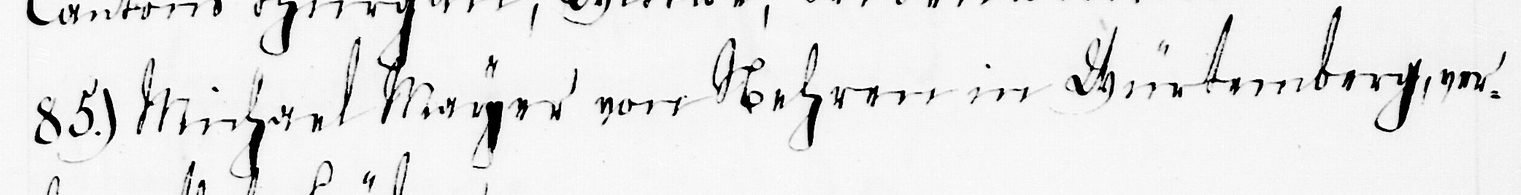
85.) Michael Meyer von Nehren in Würtemberg, ver¬
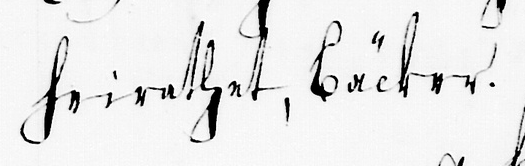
heirathet, Bäcker.
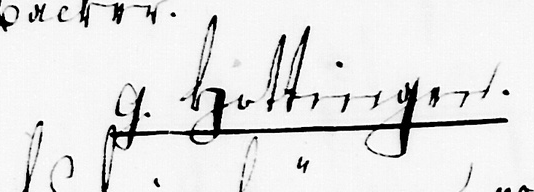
g. Hottingen
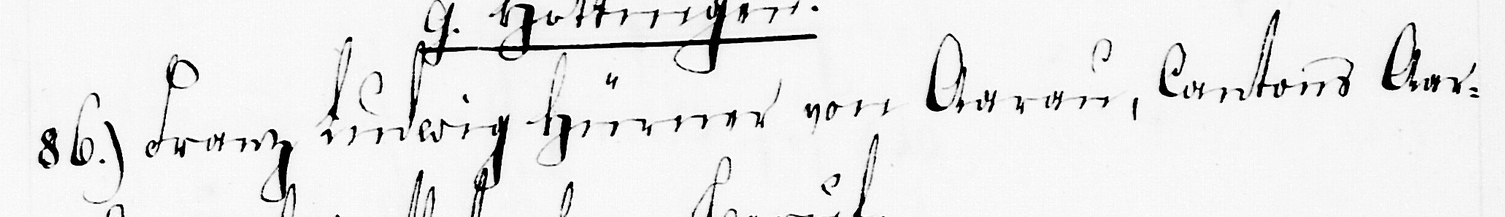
86.) Franz Ludwig Hürner von Aarau, Cantons Aar¬
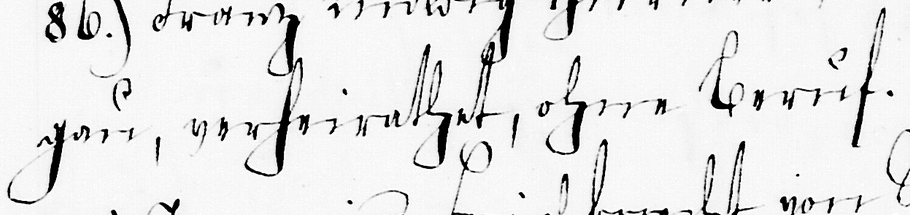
gau, verheirathet, ohne Beruf.
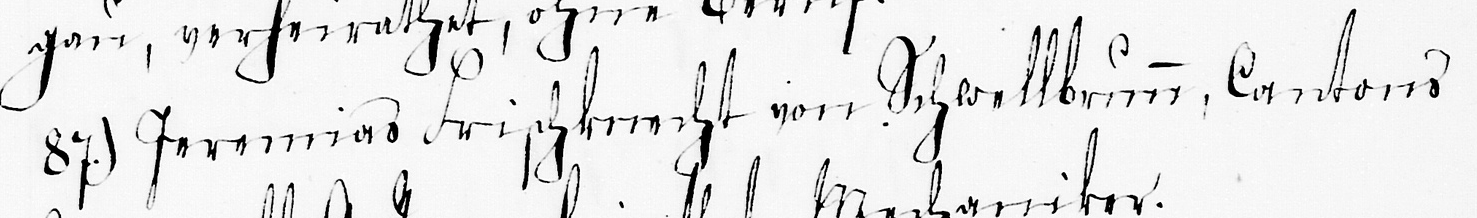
87.) Jeremias Frischknecht von Schwellbrunn, Cantons
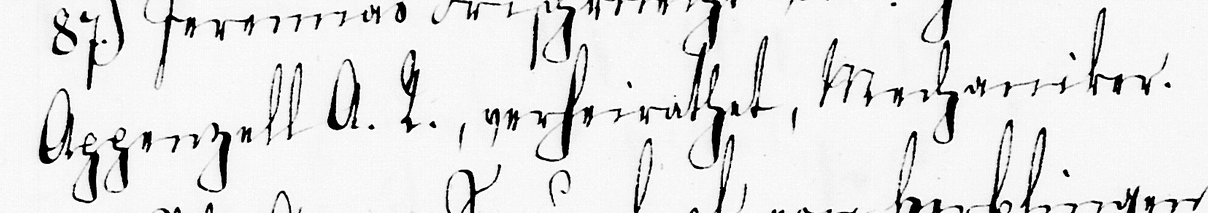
Appenzell A. R., verheirathet, Mechaniker.
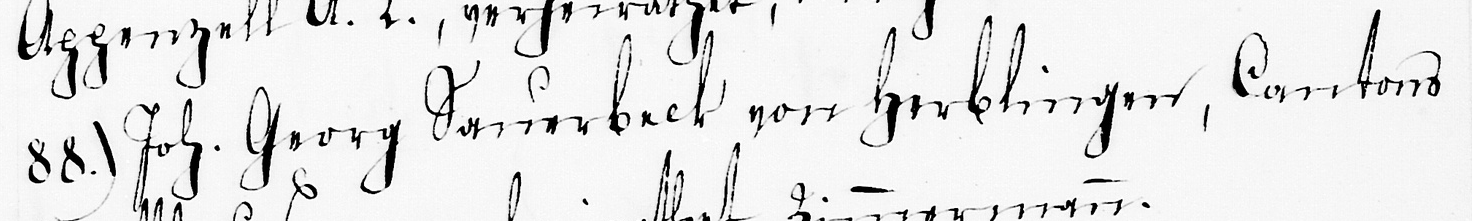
88.) Joh. Georg Sauerbeck von Herblingen, Cantons
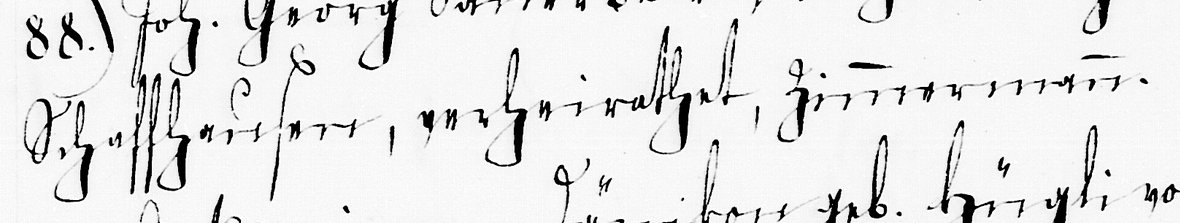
Schaffhausen, verheirathet, Zimmermann.
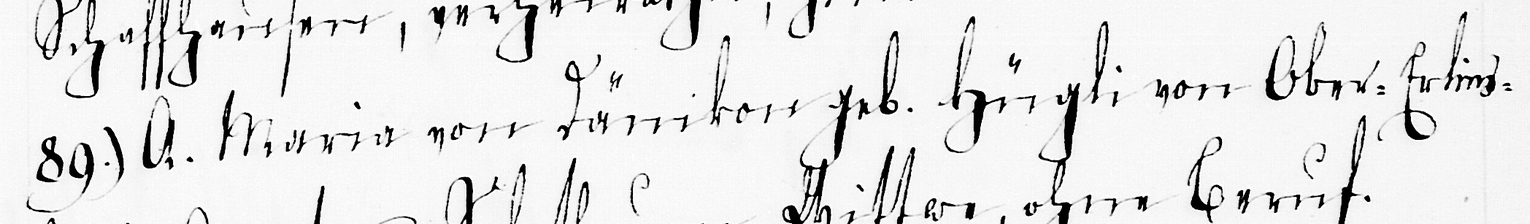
89.) A. Maria von Dänikon geb. Hügli von Ober-Erlins¬
